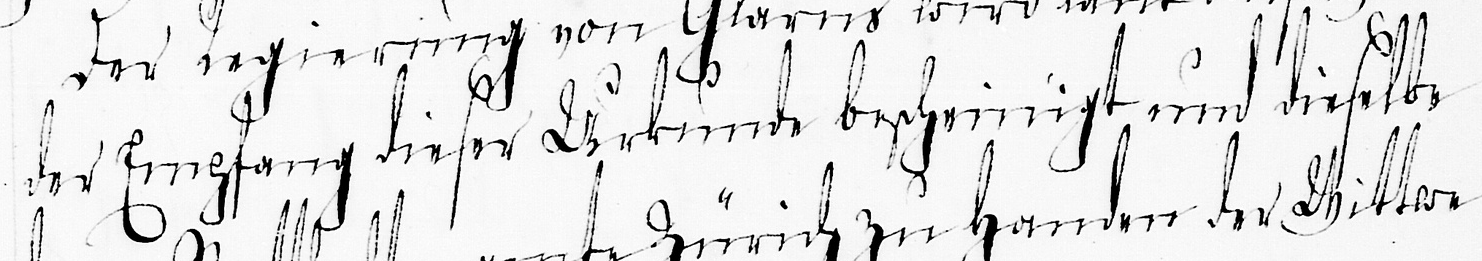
der Empfang dieser Urkunde bescheinigt und dieselbe
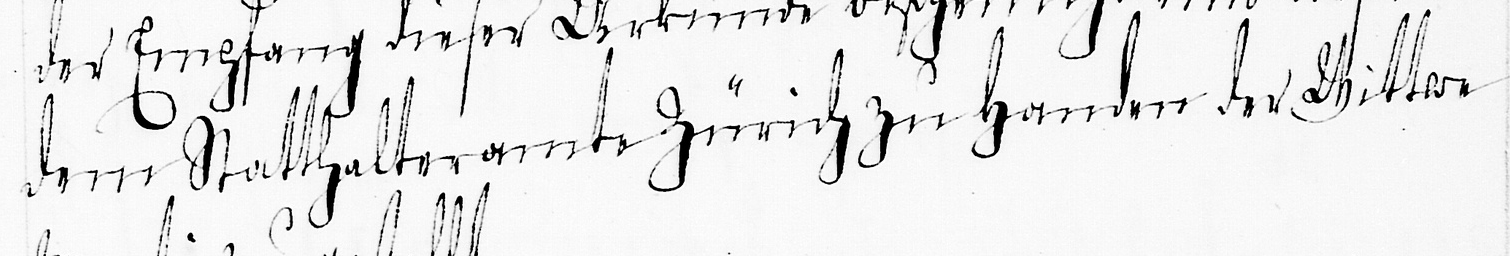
dem Statthalteramte Zürich zu Handen der Wittwe
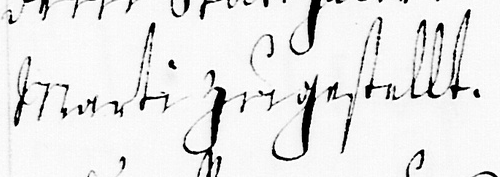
Marti zugestellt.
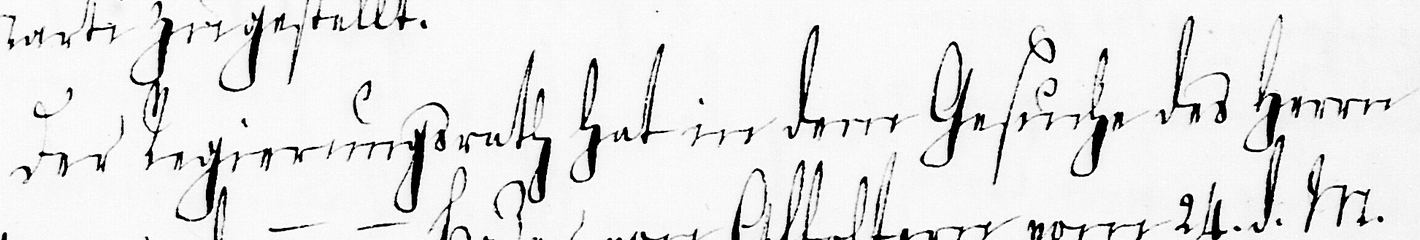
Der Regierungsrath hat in dem Gesuche des Herrn
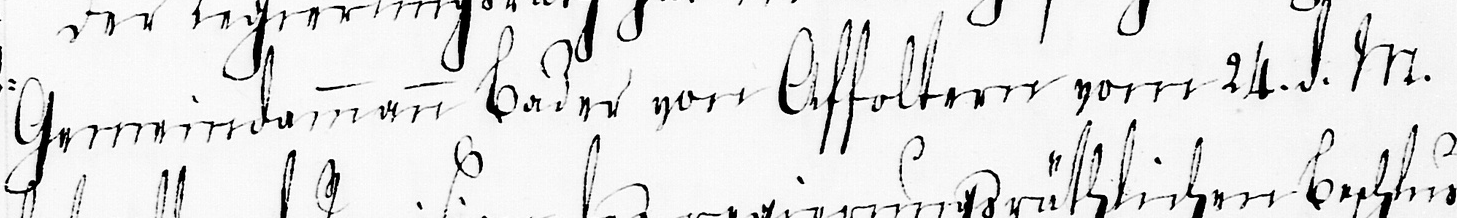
Gemeindammann Bader von Affoltern vom 24. d. M.
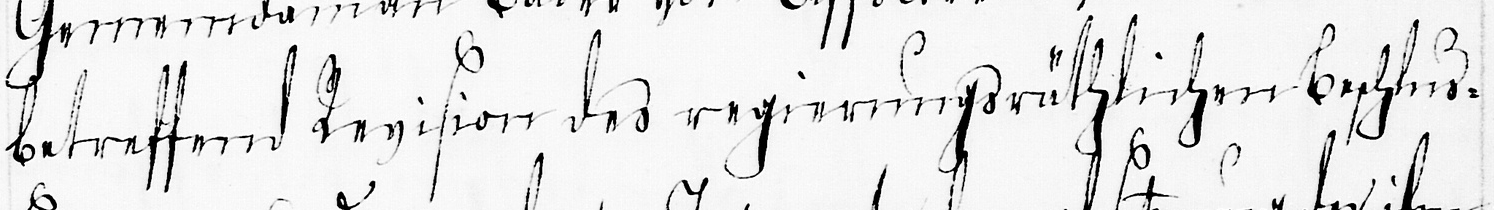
betreffend Revision des regierungsräthlichen Beschlu¬
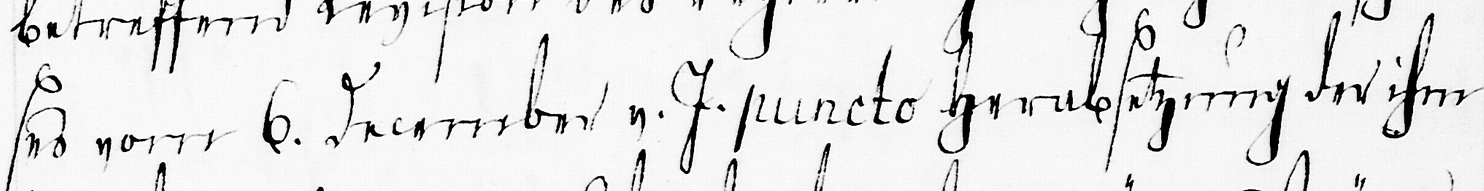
ßes vom 6. December v. J. puncto Herabsetzung der ihm
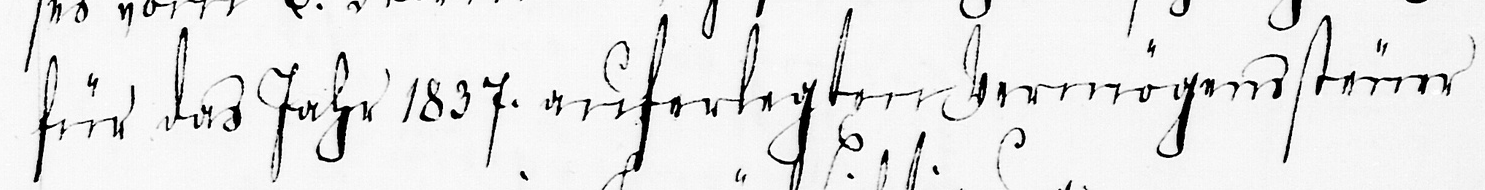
für das Jahr 1837. auferlegten Vermögenssteuer
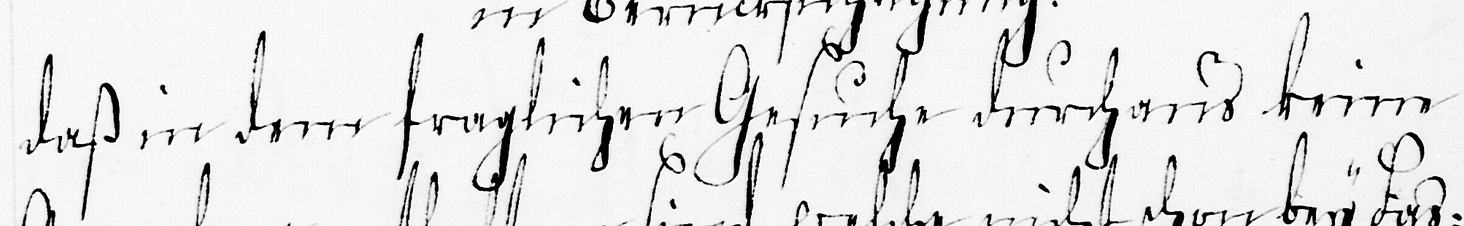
daß in dem fraglichen Gesuche durchaus keine
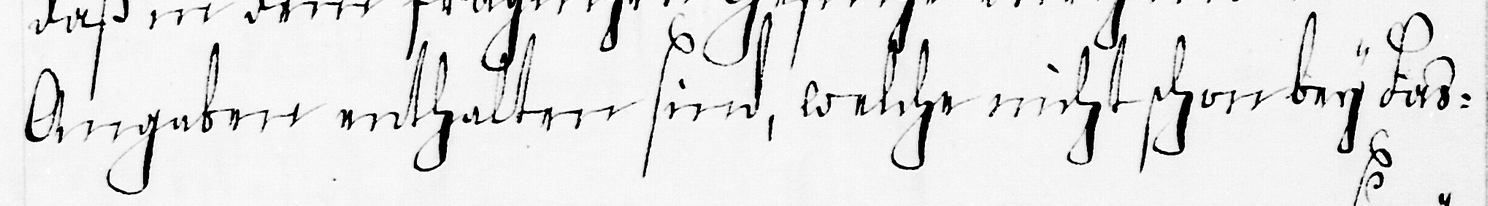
Angaben enthalten sind, welche nicht schon bey Fas-
